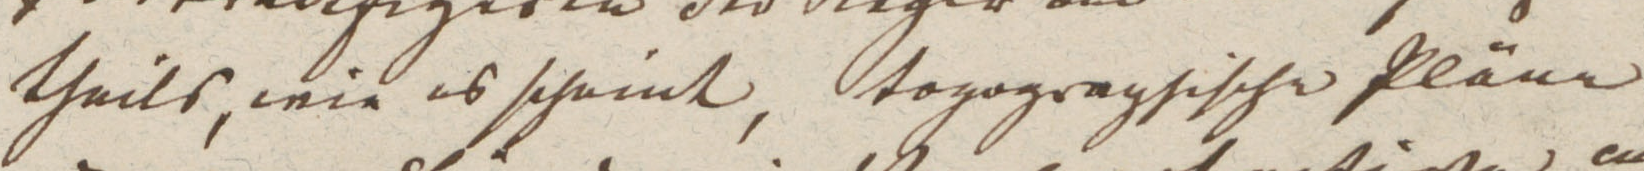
theils, wie es scheint, topographische Pläne
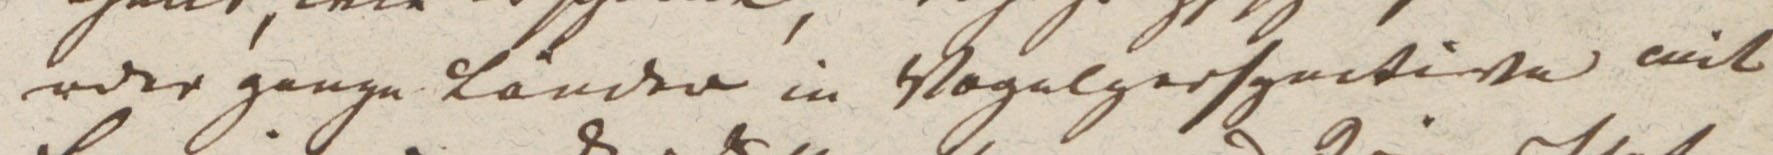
oder ganze Länder in Vogelperspective mit
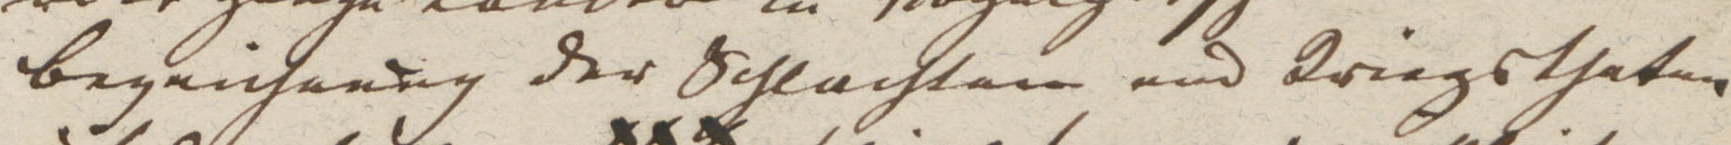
Bezeichnung der Schlachten und Kriegsthaten
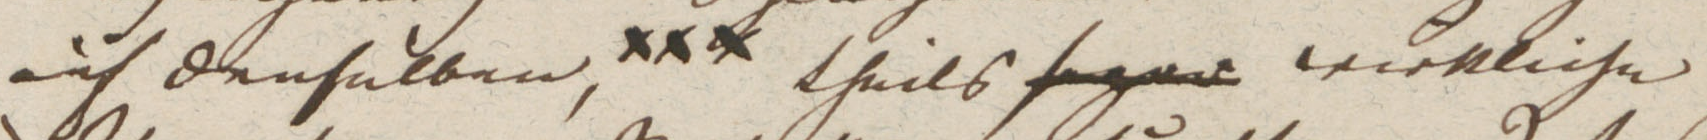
auf denselben, % theils sogar wirkliche
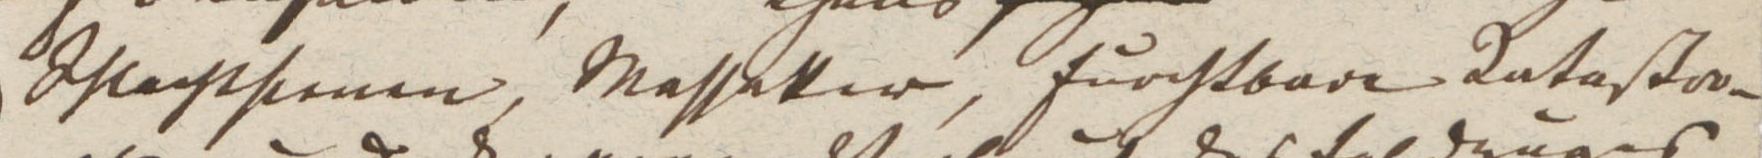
Schlachtscenen, Massaker, furchtbare Katastro-
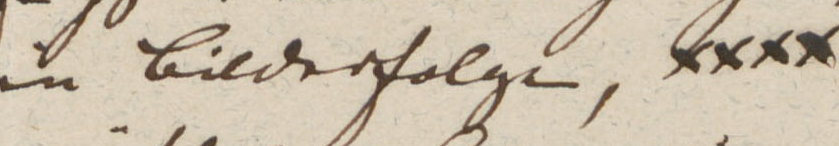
in Bilderfolge, %
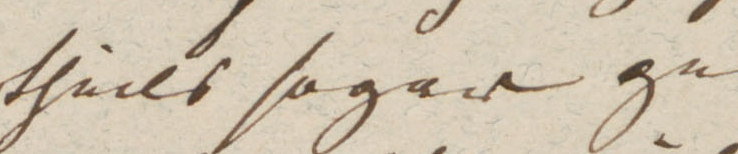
theils sogar ge-
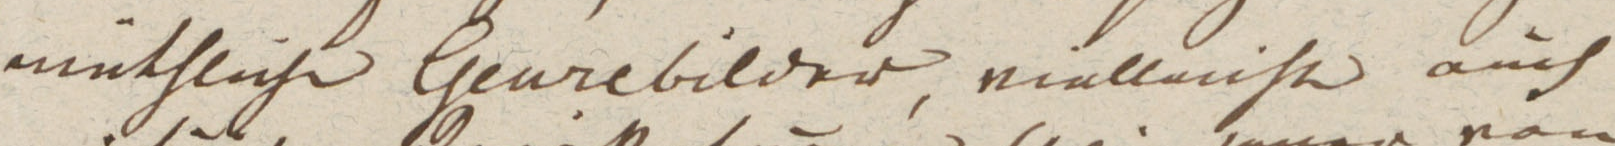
müthliche Genrebilder, vielleicht auch
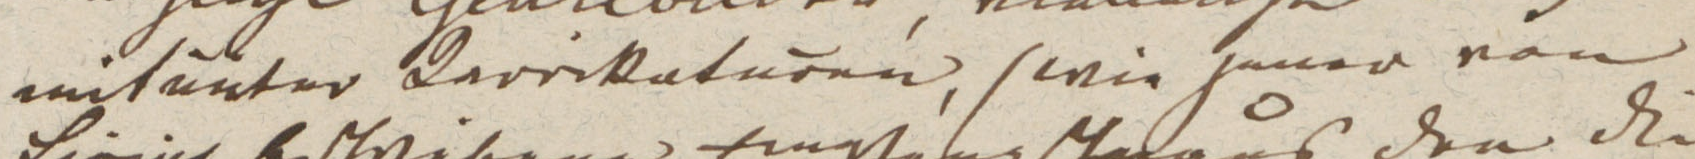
mitunter Karrikaturen, (wie jener von
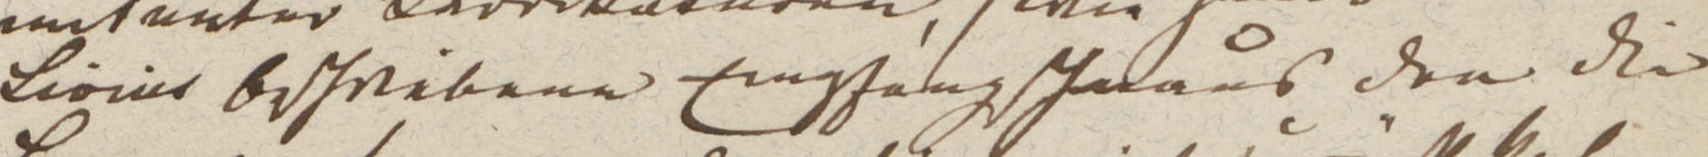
Livius beschriebene Empfangschmaus den die
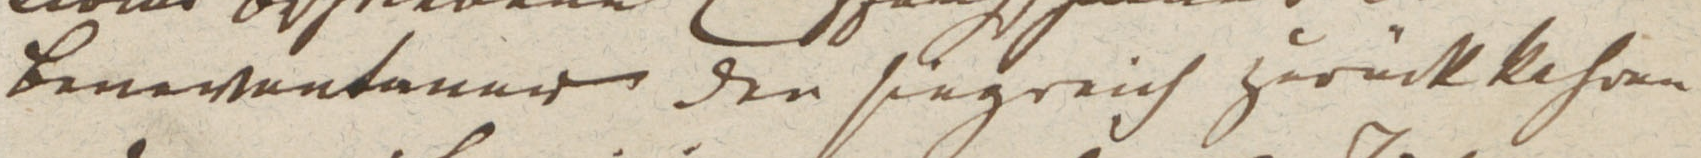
Benewentaner den siegreich kehren
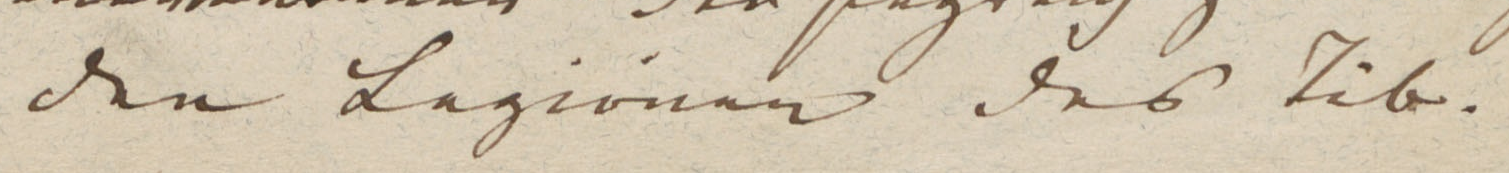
den Legionen des Tib.
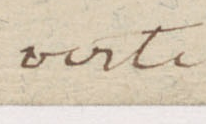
die ergreifenden
